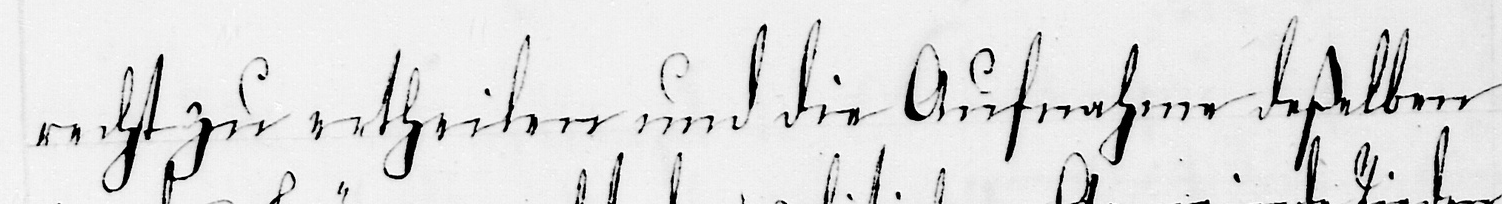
recht zu ertheilen und die Aufnahme deßelben
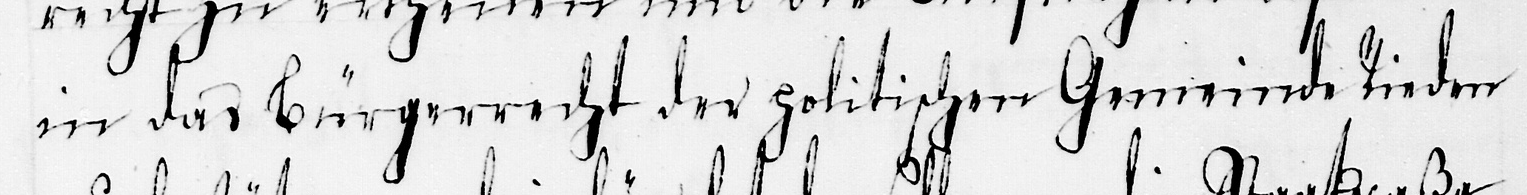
in das Bürgerrecht der politischen Gemeinde Rieden
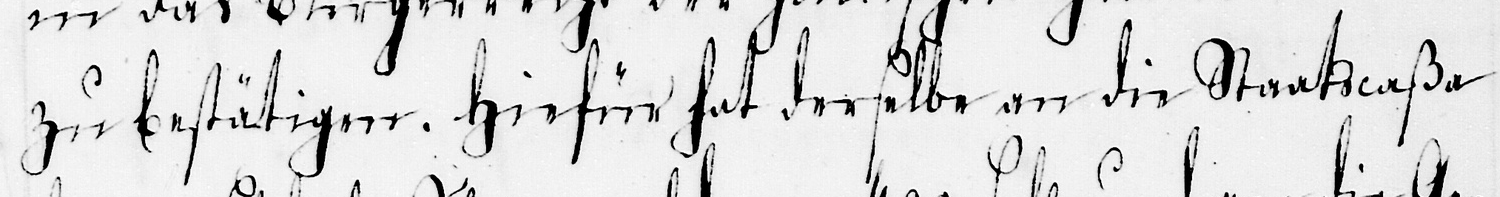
zu bestätigen. Hiefür hat derselbe an die Staatscaßa
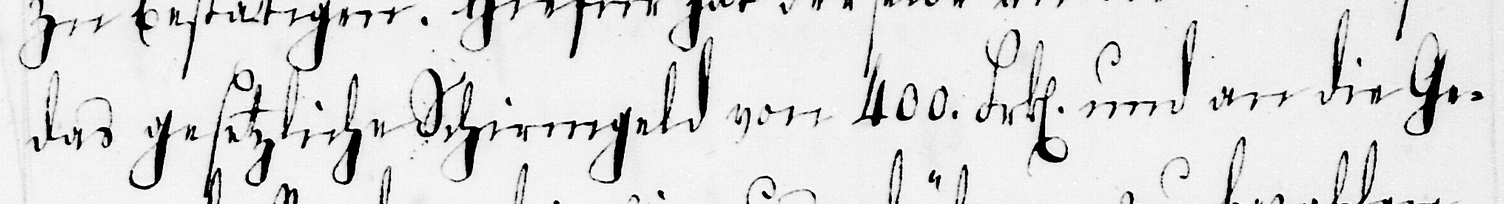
das gesetzliche Schirmgeld von 400. Frk[en]. und an die Ge¬
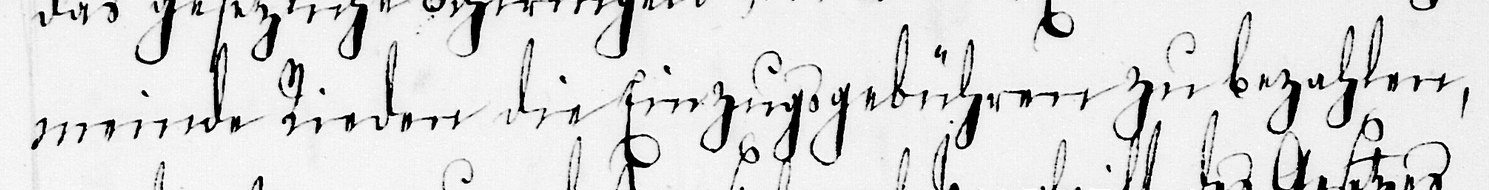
meinde Rieden die Einzugsgebühren zu bezahlen,
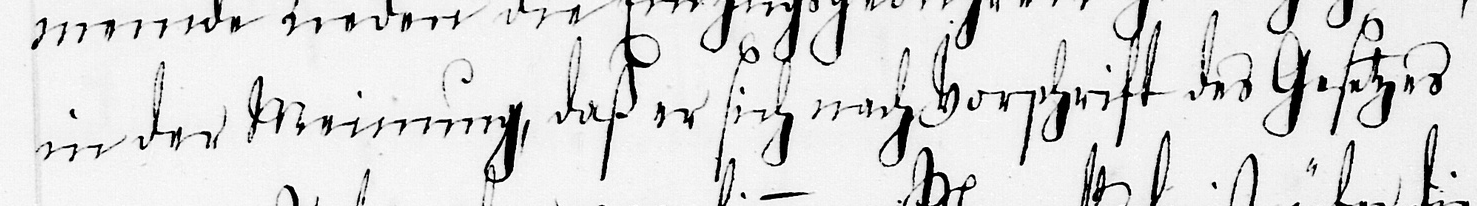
in der Meinung, daß er sich nach Vorschrift des Gesetzes
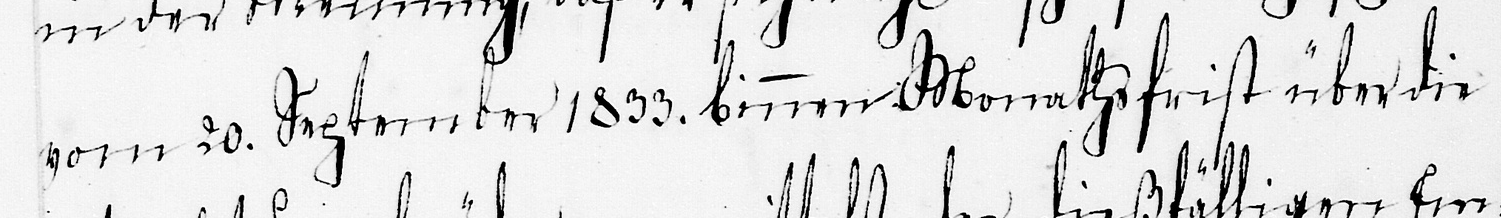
vom 20. September 1833. binnen Monathsfrist über die
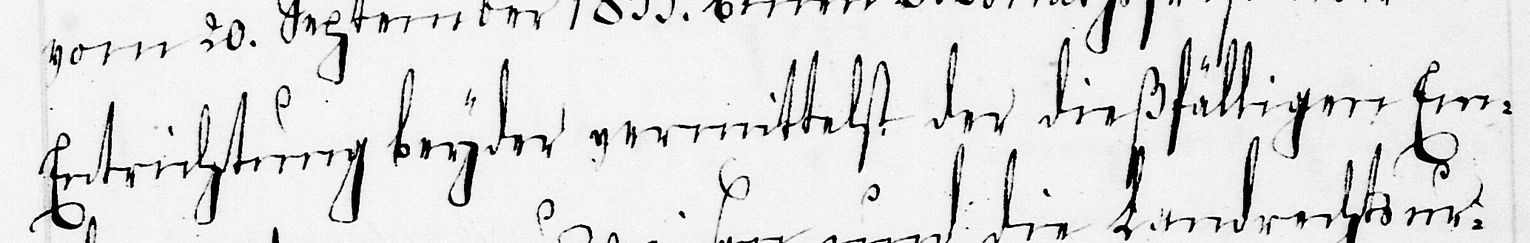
Entrichtung beyder vermittelst der dießfälligen Em¬
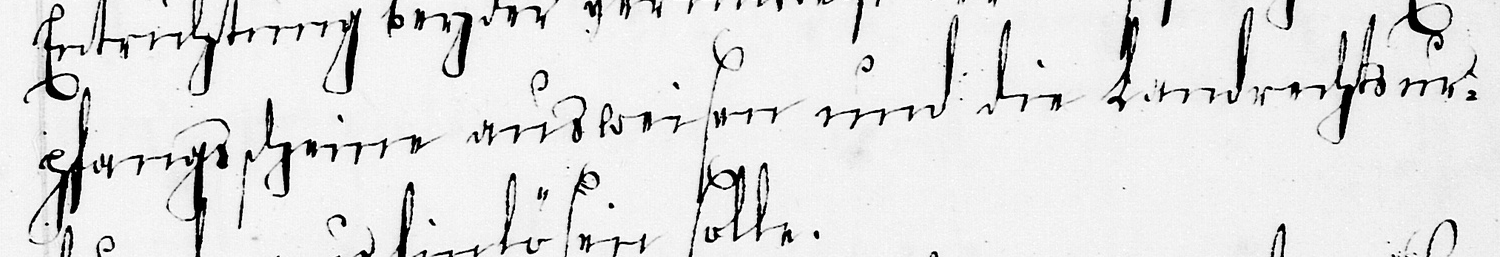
pfangsscheine ausweisen und die Landrechtsur¬
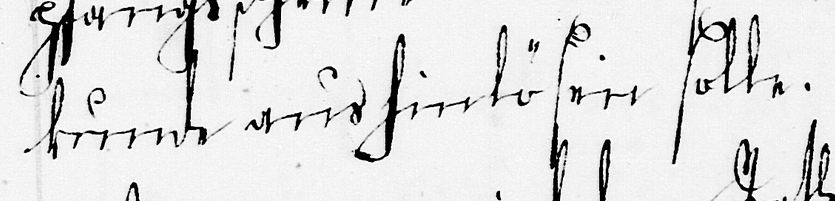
kunde aushinlösen solle.
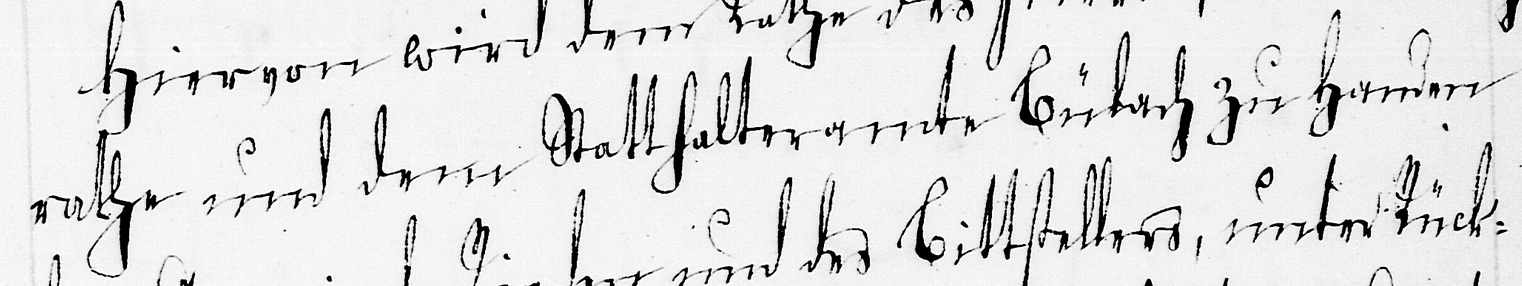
rathe und dem Statthalteramte Bülach zu Handen
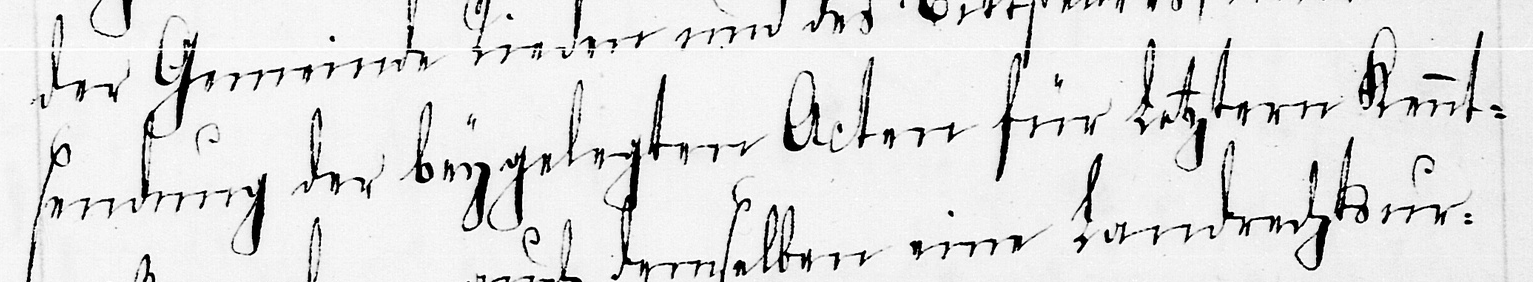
sendung der beygelegten Acten für Letztern Kennt¬
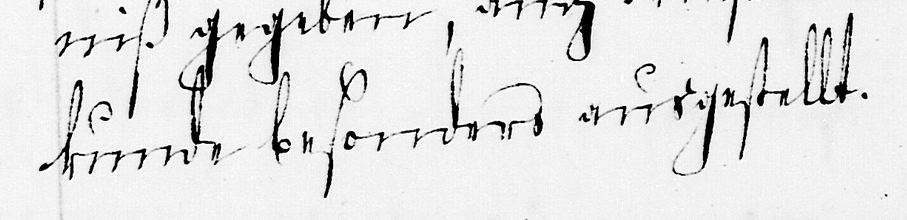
kunde besonders ausgestellt.
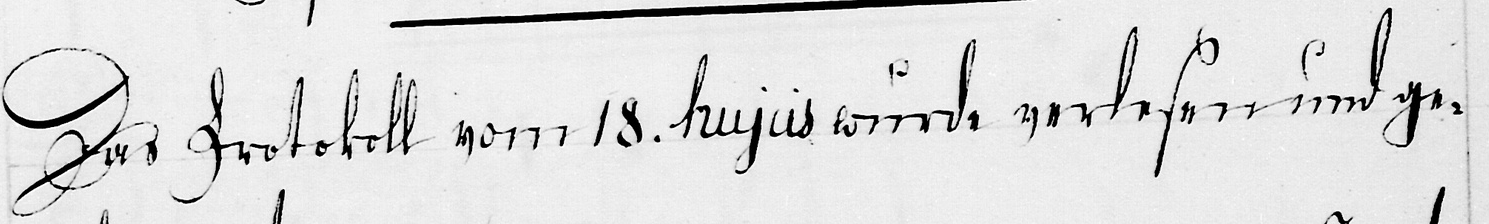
Das Protokoll vom 18. hujus wurde verlesen und ge¬
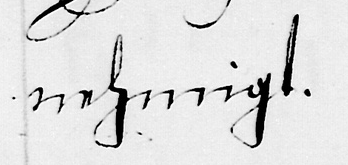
nehmigt.
